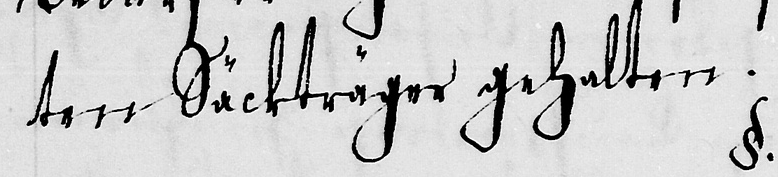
lten Säckträger gehalten.
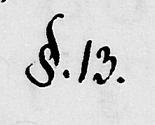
§.13.
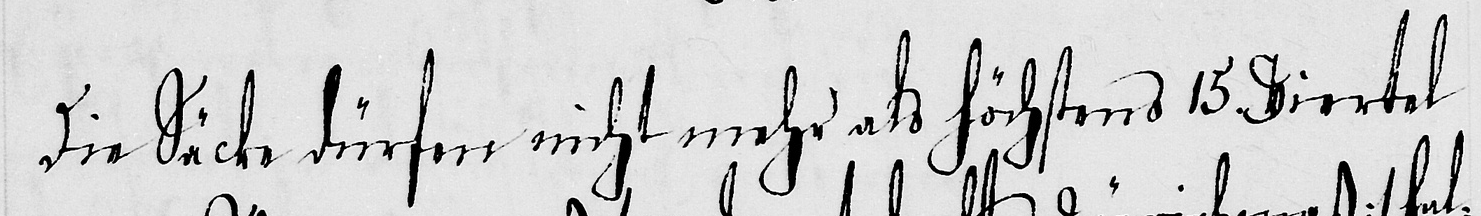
Die Säcke dürfen nicht mehr als Höchstens 15. Viertel
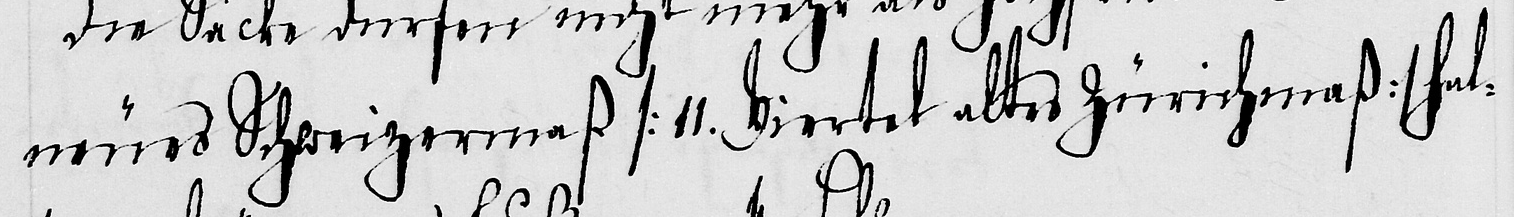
neues Schweizermaß [11. Viertel altes Zürichmaß] hal¬
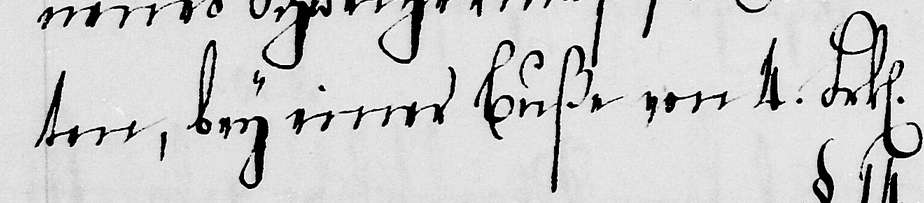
ten, bey einer Buße von 4. Fr¬
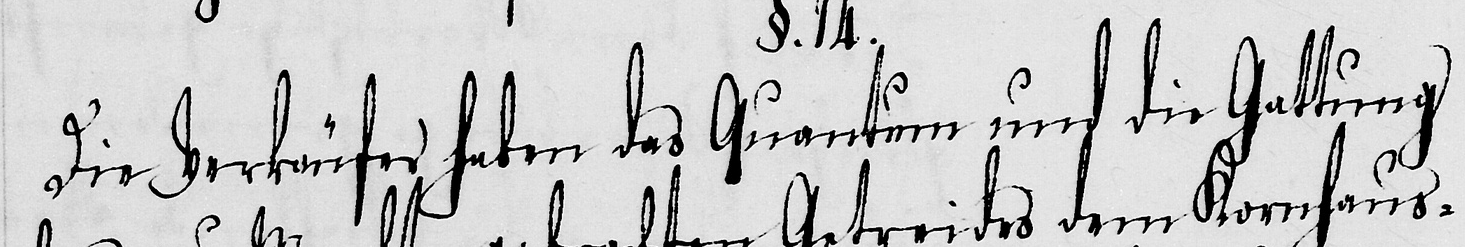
Die Verkäufer haben das Quantum und die Gattung
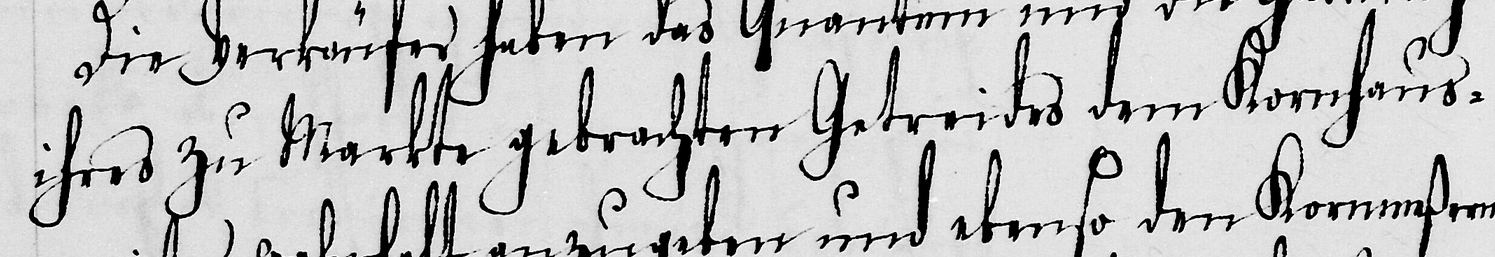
ihres zu Markte gebrachten Getreides dem Kornhaus¬
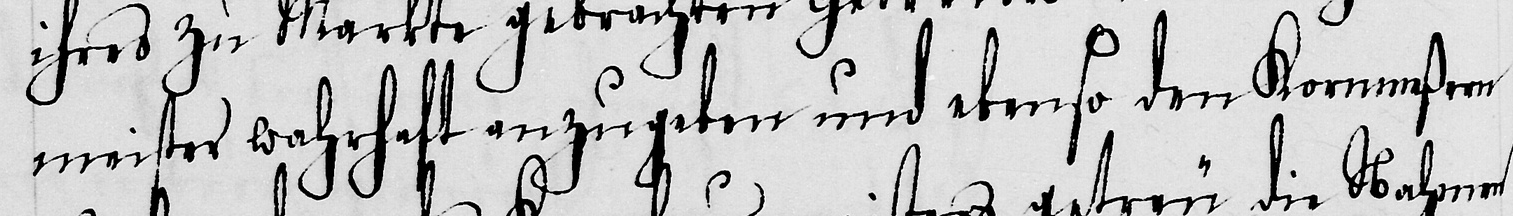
meister wahrhaft anzugeben und ebenso den Kornmeßern
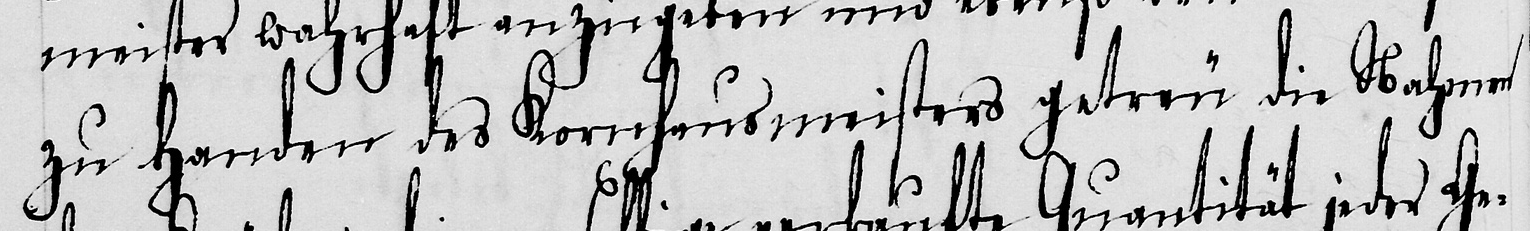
zu Handen des Kornhausmeisters getreu die Nahmen
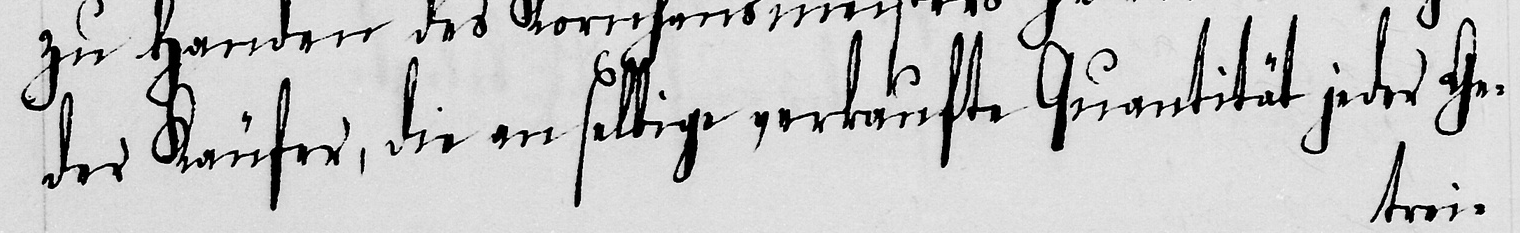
der Käufer, die an selbige verkaufte Quantität jeder Ge-
